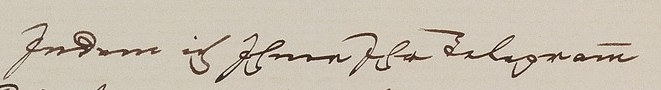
Indem ich Ihnen Ihr Telegramm
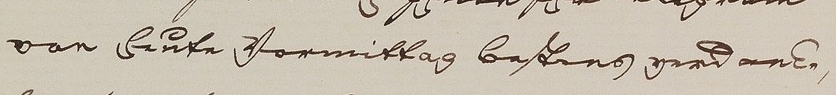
von heute Vormittag bestens verdanke,
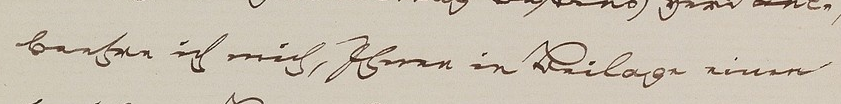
beehre ich mich, Ihnen in Beilage einen
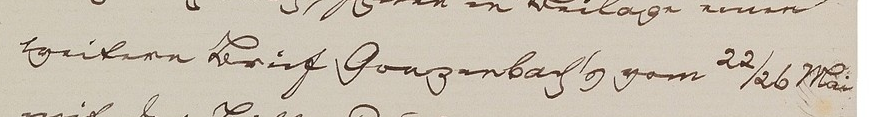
weitern Brief Gonzenbach's vom 22/ 26 Mai
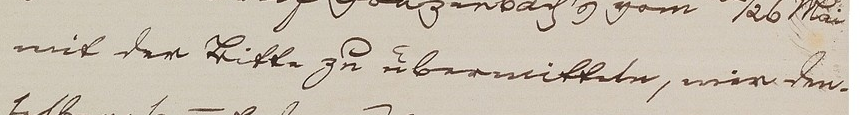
mit der Bitte zu übermitteln, mir den-
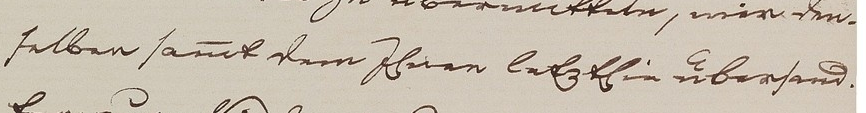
selben sammt dem Ihnen letzthin übersand-
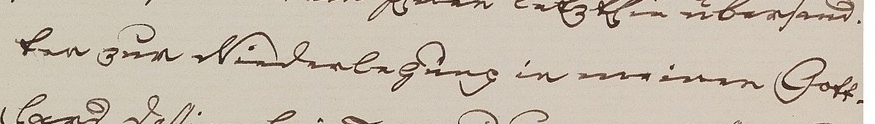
ten zur Niederlegung in meinen Gott-
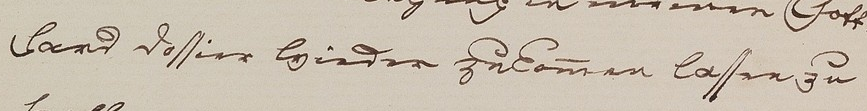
hard Dossier wieder zukommen lassen zu
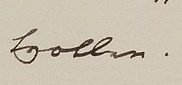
wollen.
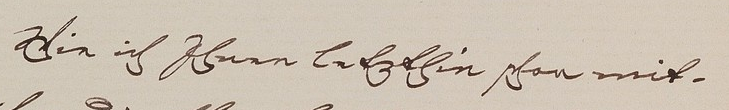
Wie ich Ihnen letzthin schon mit-
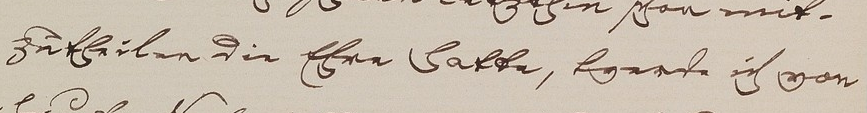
zutheilen die Ehre hatte, werde ich von
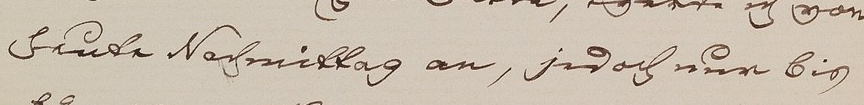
heute Nachmittag an, jedoch nur bis
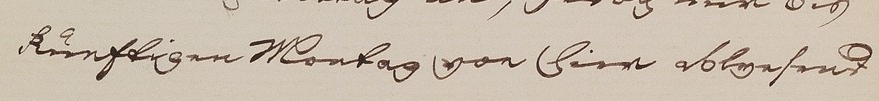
künftigen Montag von hier abwesend
